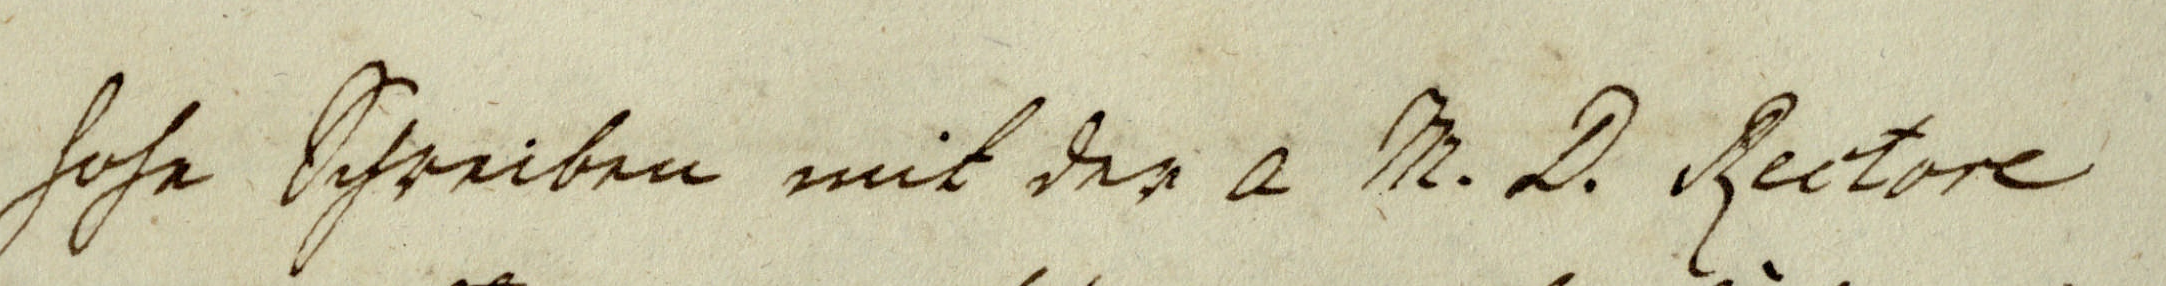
hohe Schreiben mit der a M. D. Rectore
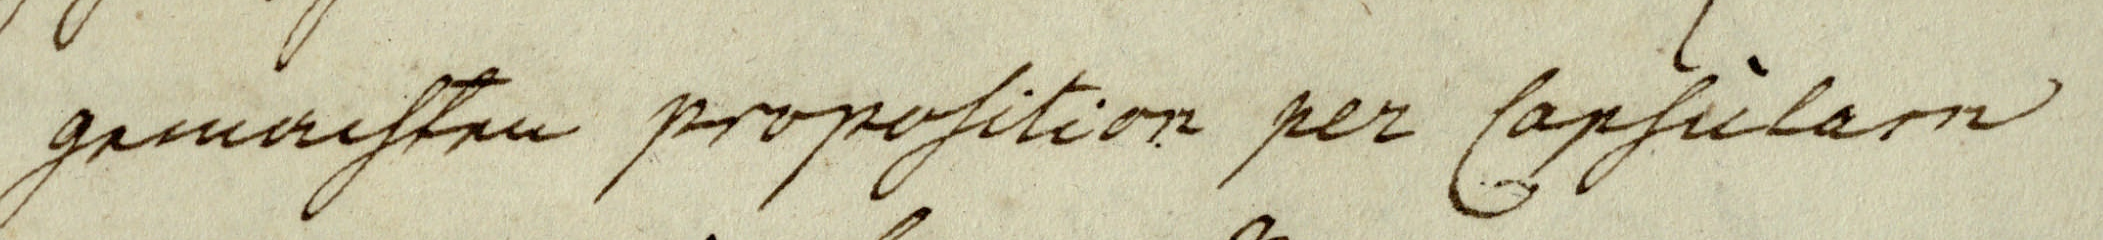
gemachten proposition per Capsulam
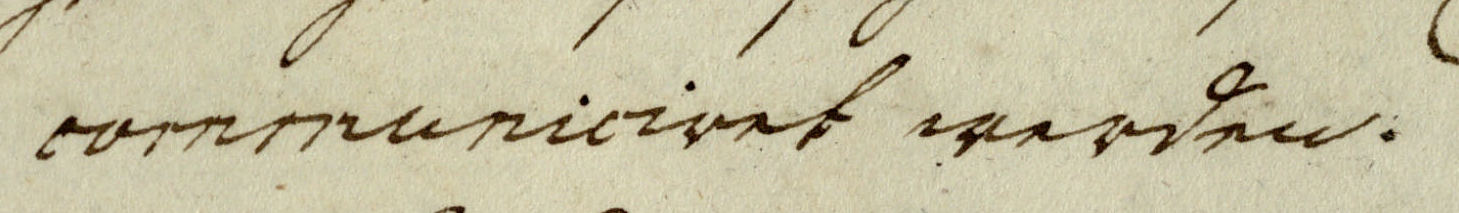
communiciret werden.
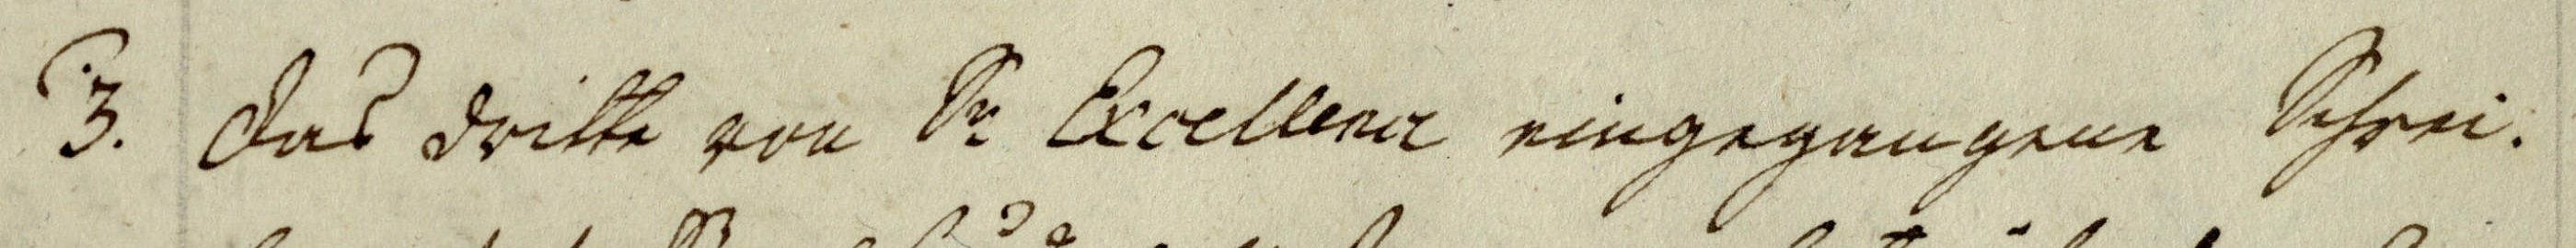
3. Das dritte von Sr Excellence eingegangene Schrei¬
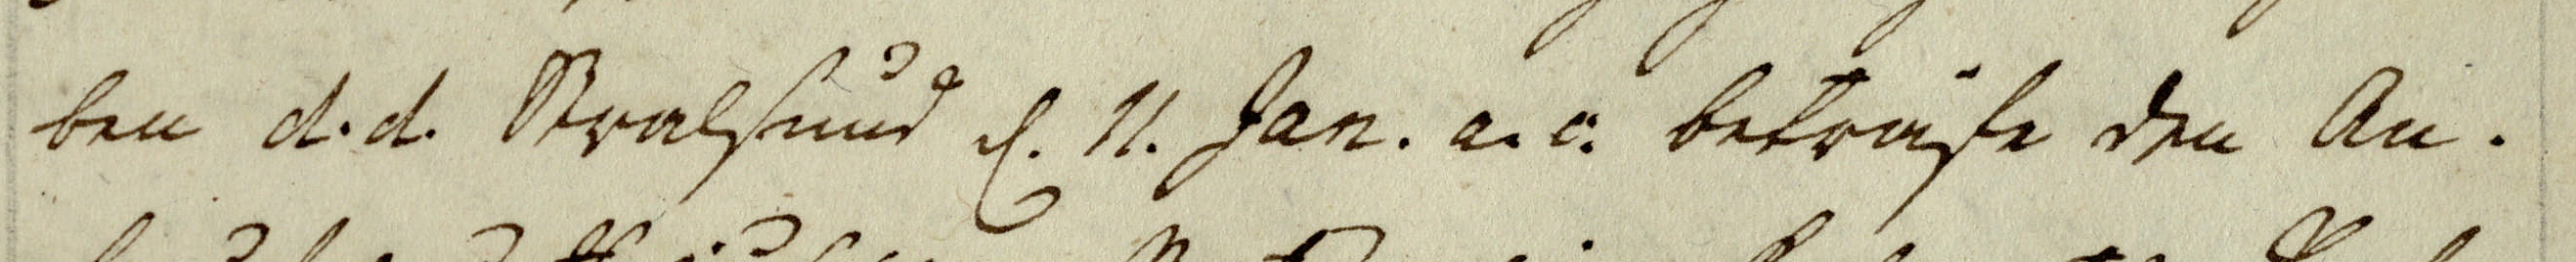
ben d. d. Stralsund d. 11. Jan. a. c. beträfe den An¬
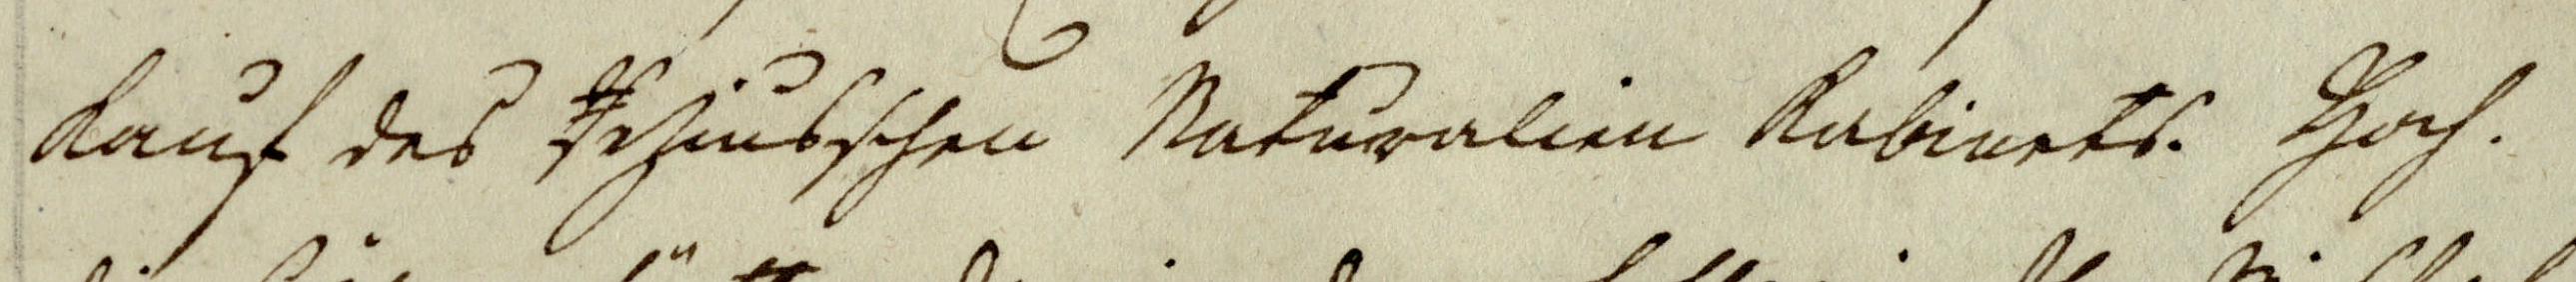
kauf des Reziusschen Naturalien Kabinets. Hoch¬
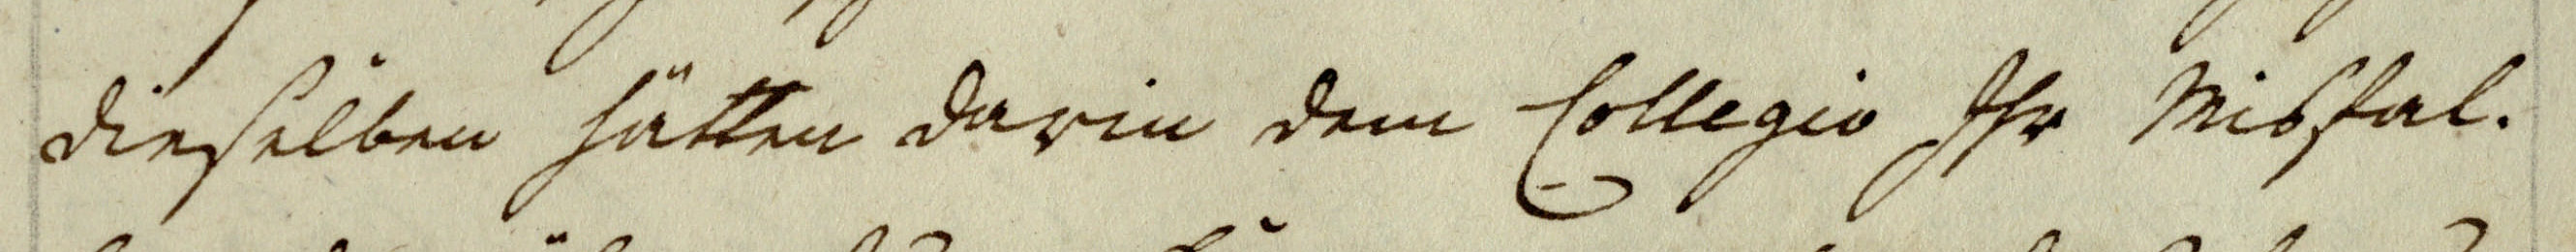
dieselben hätten darin dem Collegio ihr Misfal¬
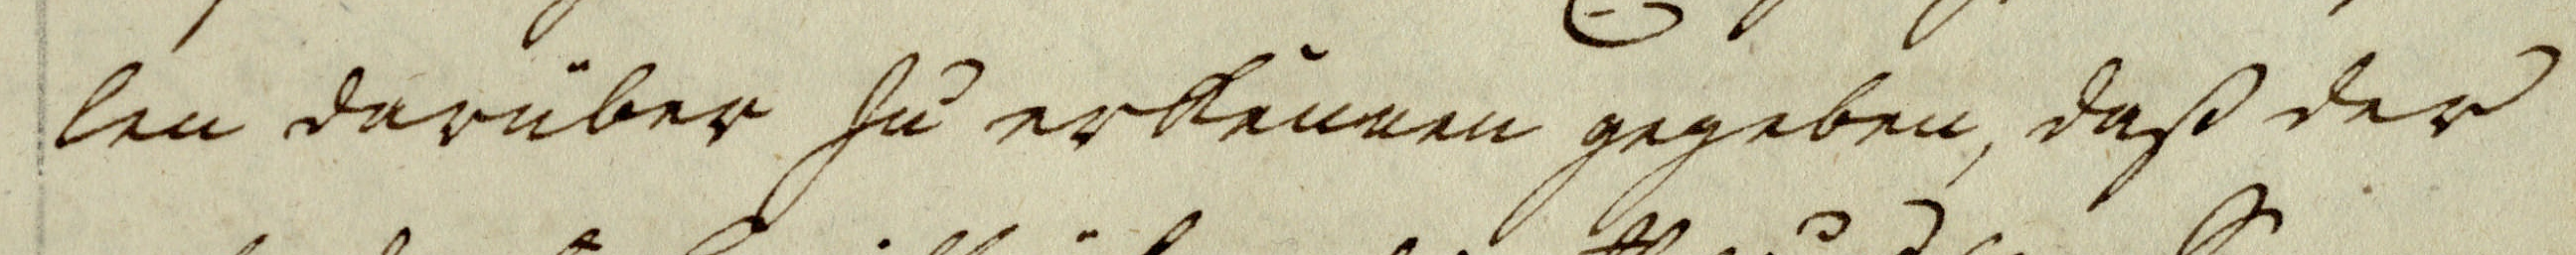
len darüber zu erkennen gegeben, daß der
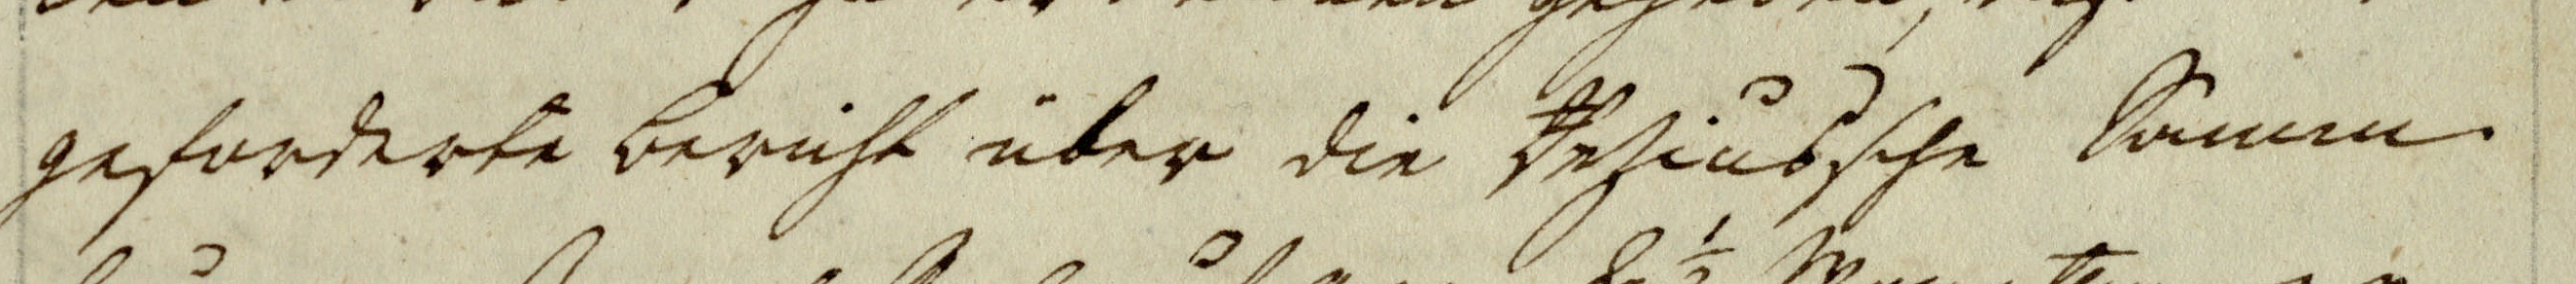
geforderte Bericht über die Reziussche Samm¬
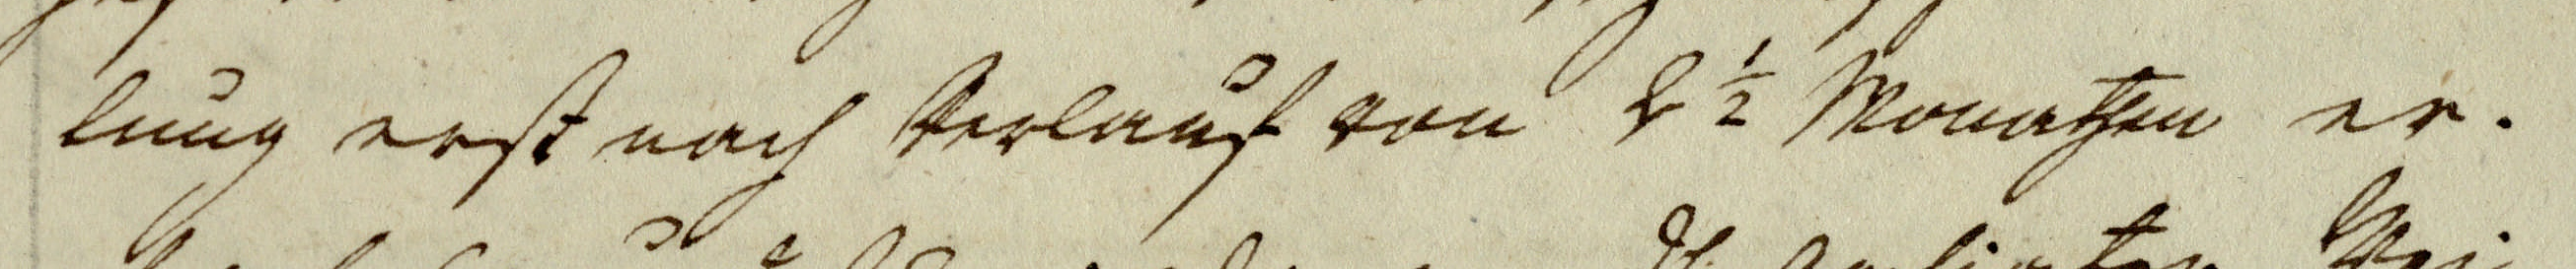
lung erst nach Verlauf von 2½ Monathen er¬
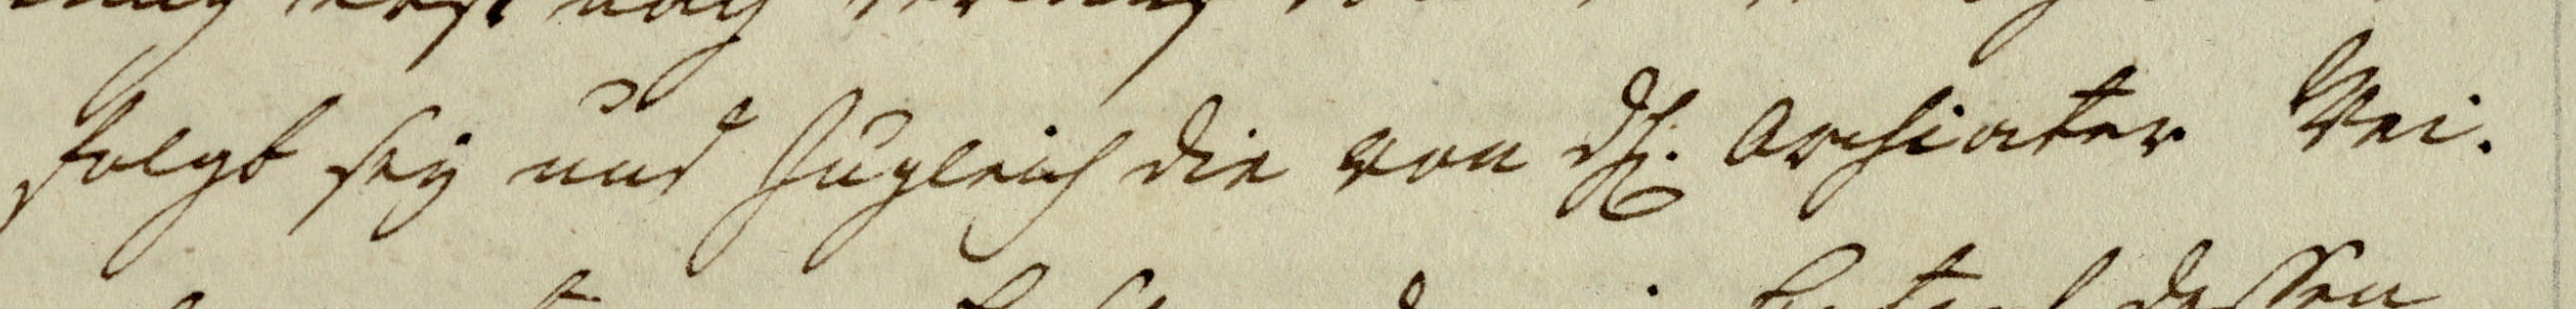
folgt seÿ und zugleich die von dh. Archiater Wei¬
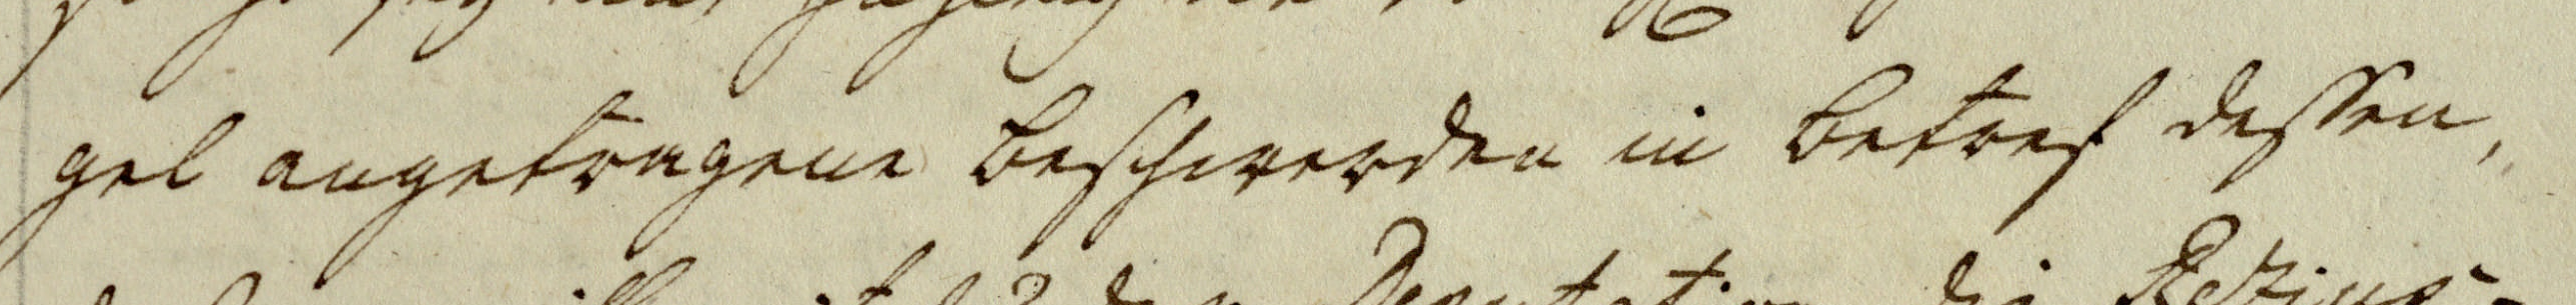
gel angetragene Beschwerden in Betref dessen,
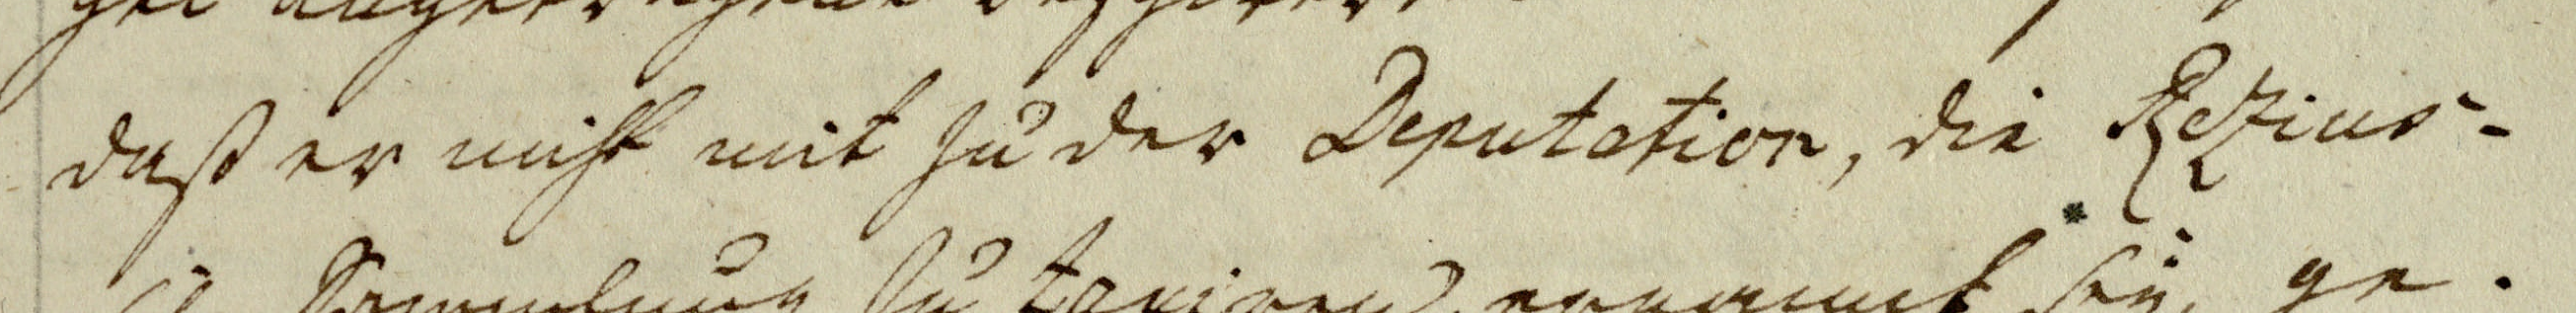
daß er nicht mit zu der Deputation, die Rezius¬
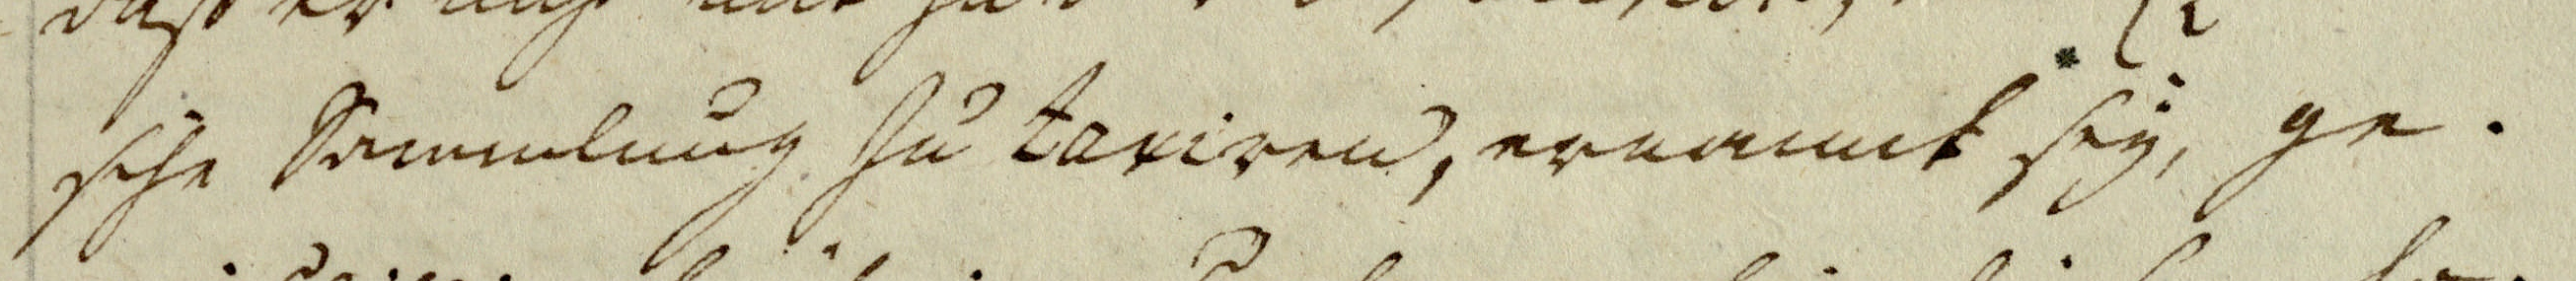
sche Sammlung zu taxiren, ernannt seÿ, ge-
